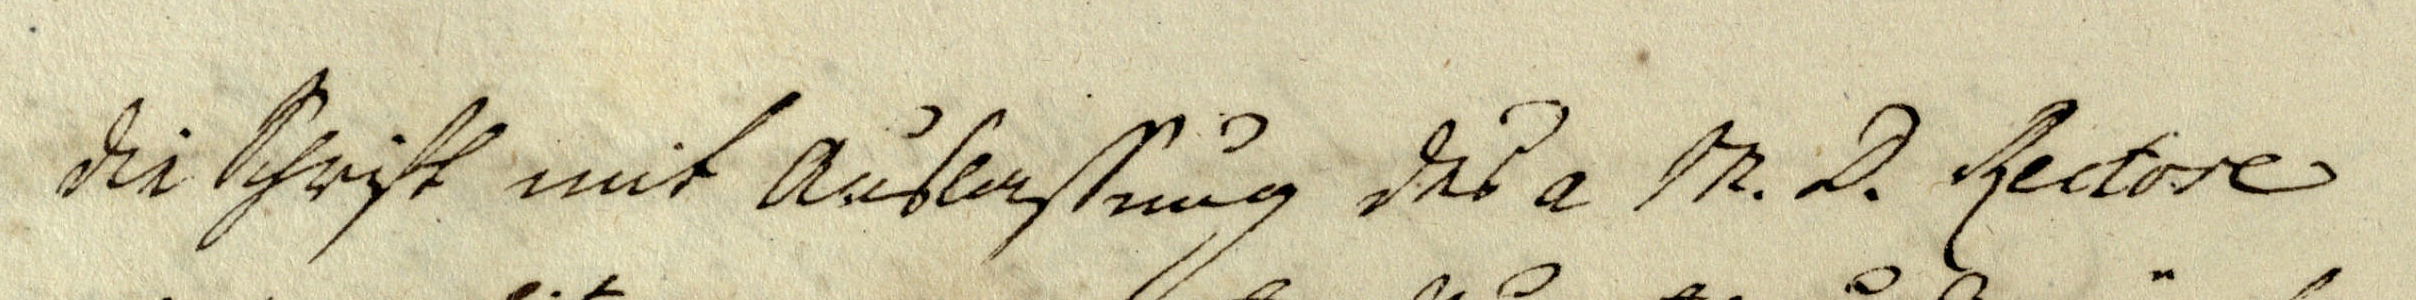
die Schrift mit Auslassung des a M. D. Rectore
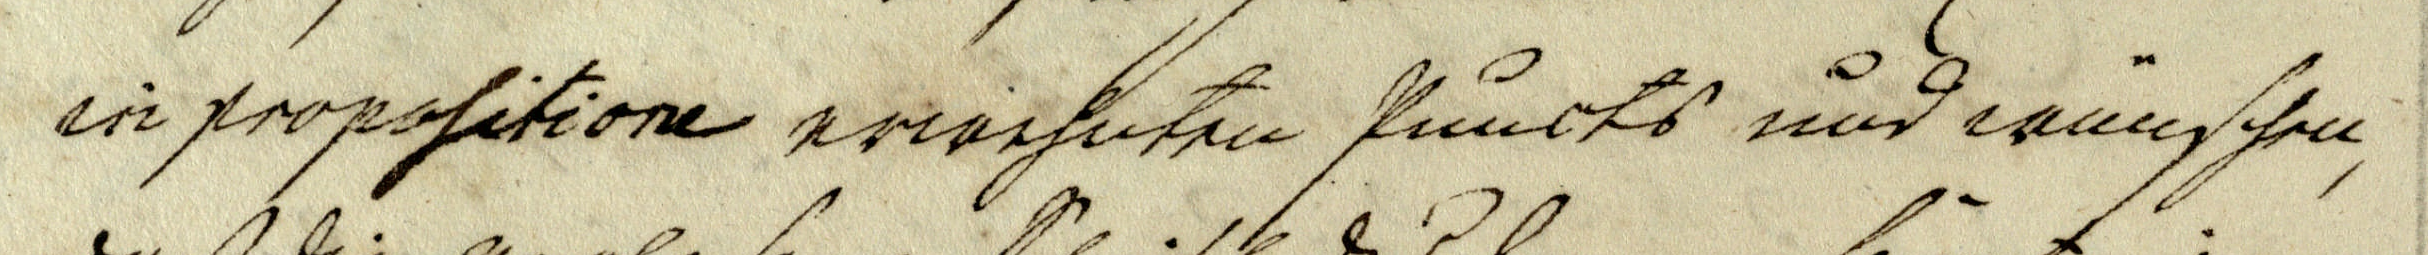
in propositione erwehnten Puncts und wünschen,
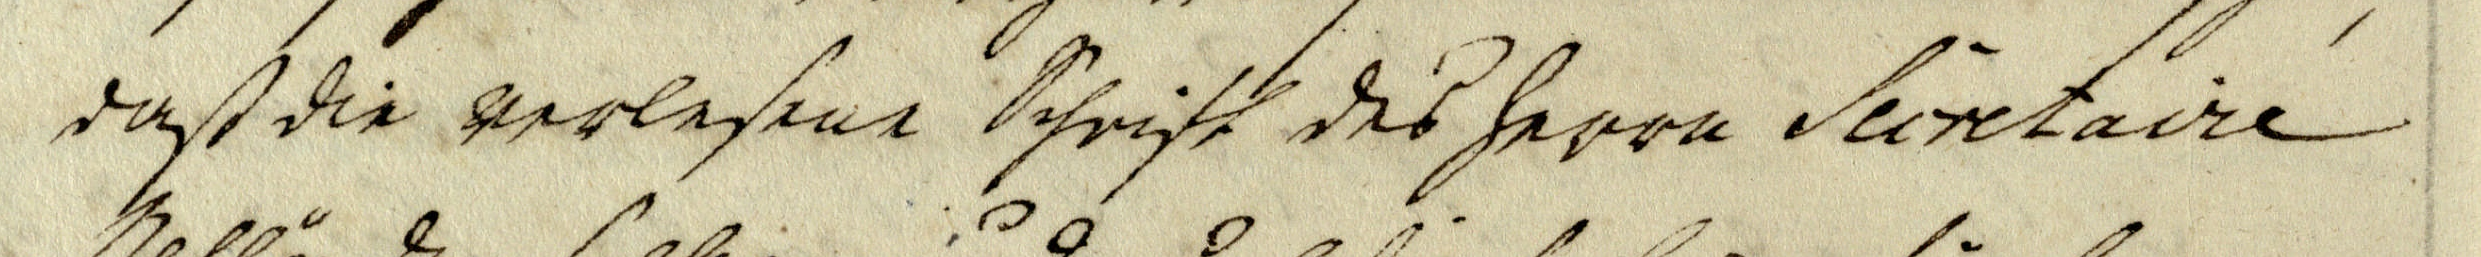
daß die verlesene Schrift des Herrn Secretaire
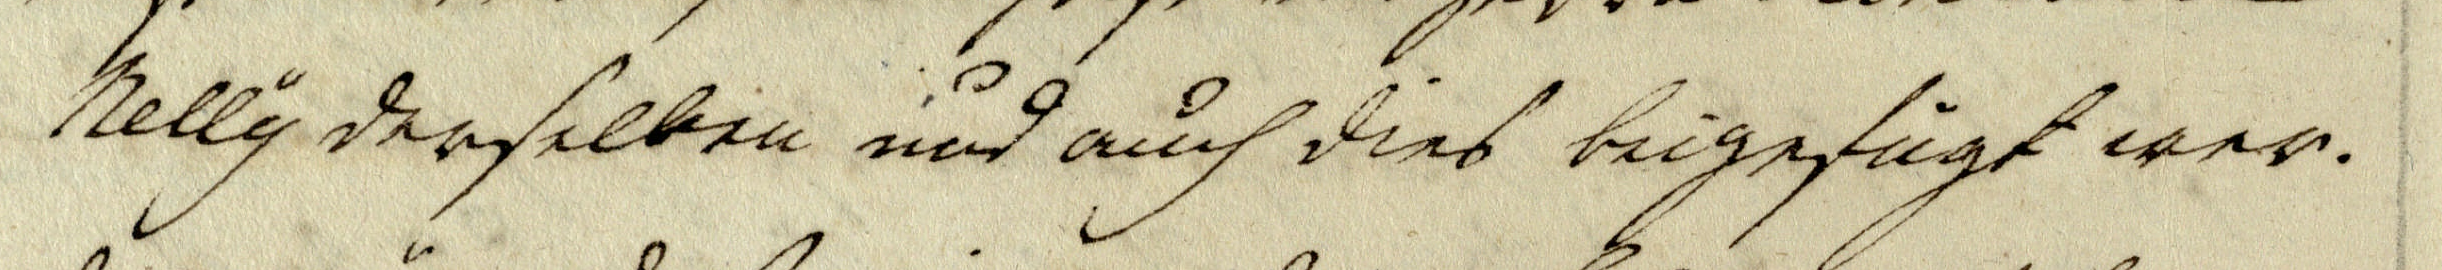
Nellÿ derselben und auch dies beigefügt wer¬
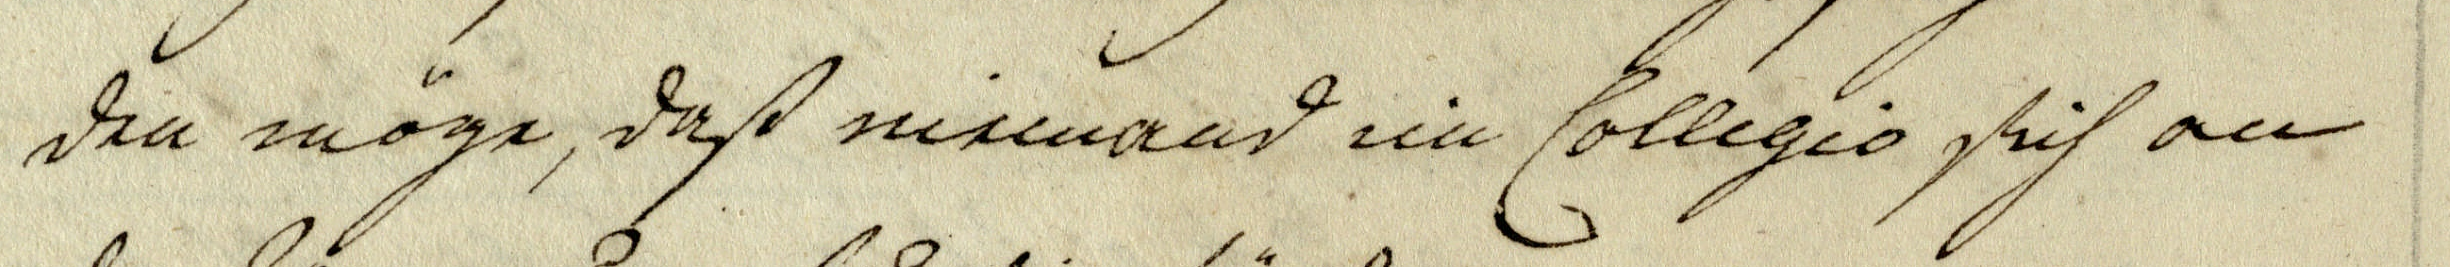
den möge, daß niemand im Collegio sich an
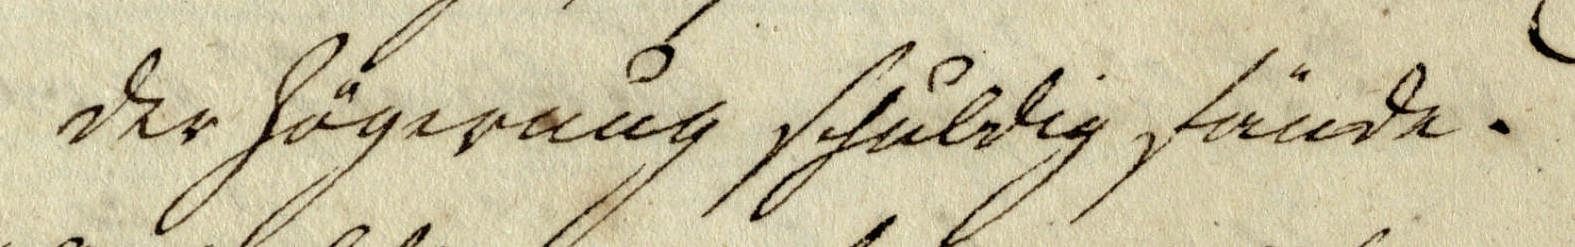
der Zögerung schuldig fände.
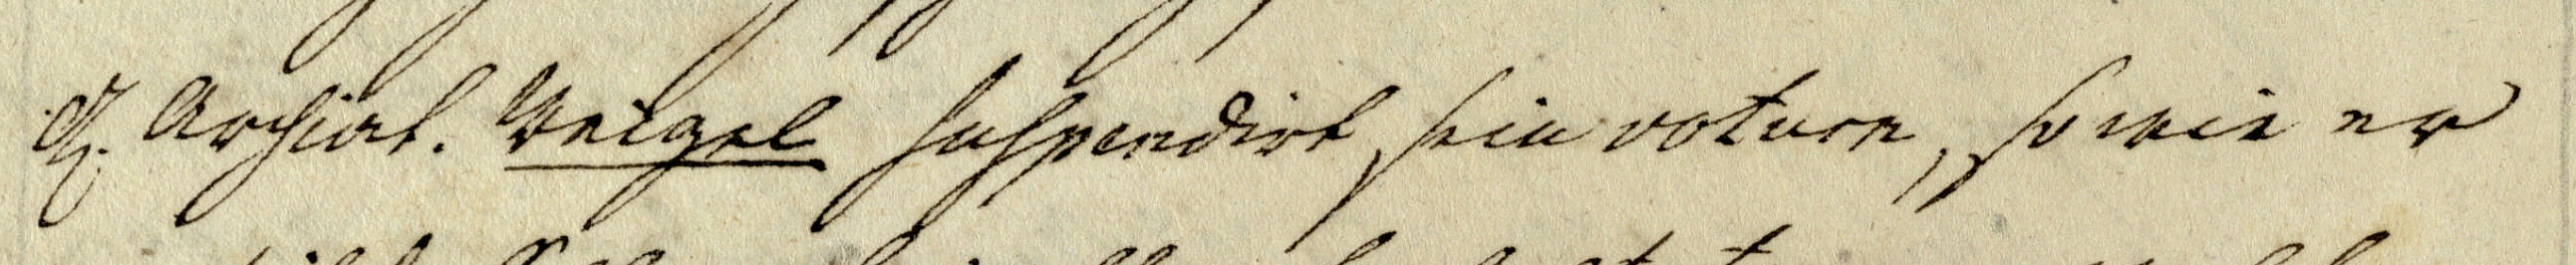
dh. Archiat. Weigel. suspendirt sein votum, so wie er
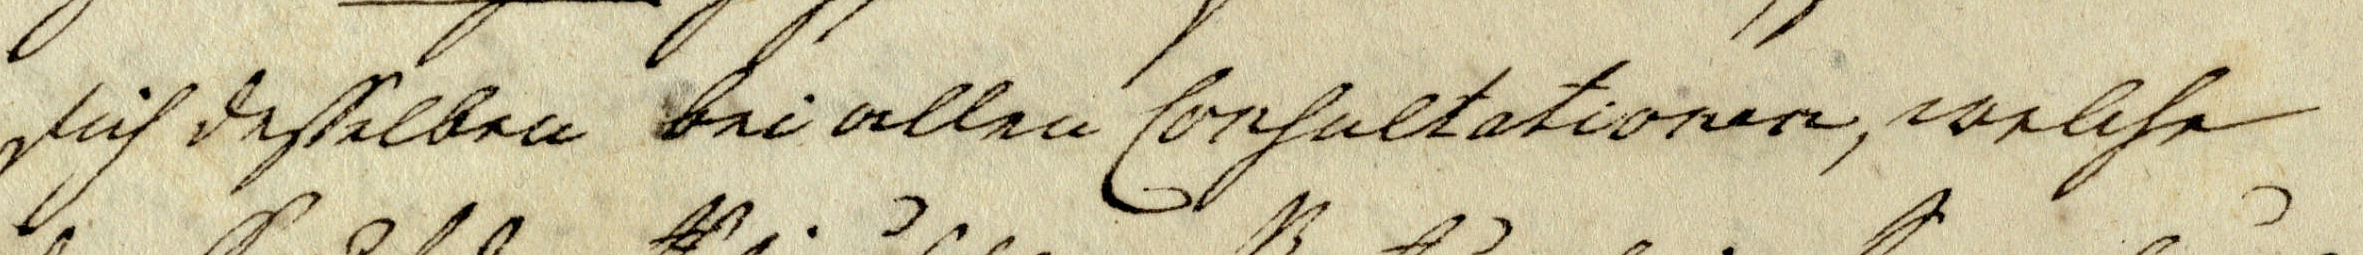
sich desselben bei allen Consultationen, welche
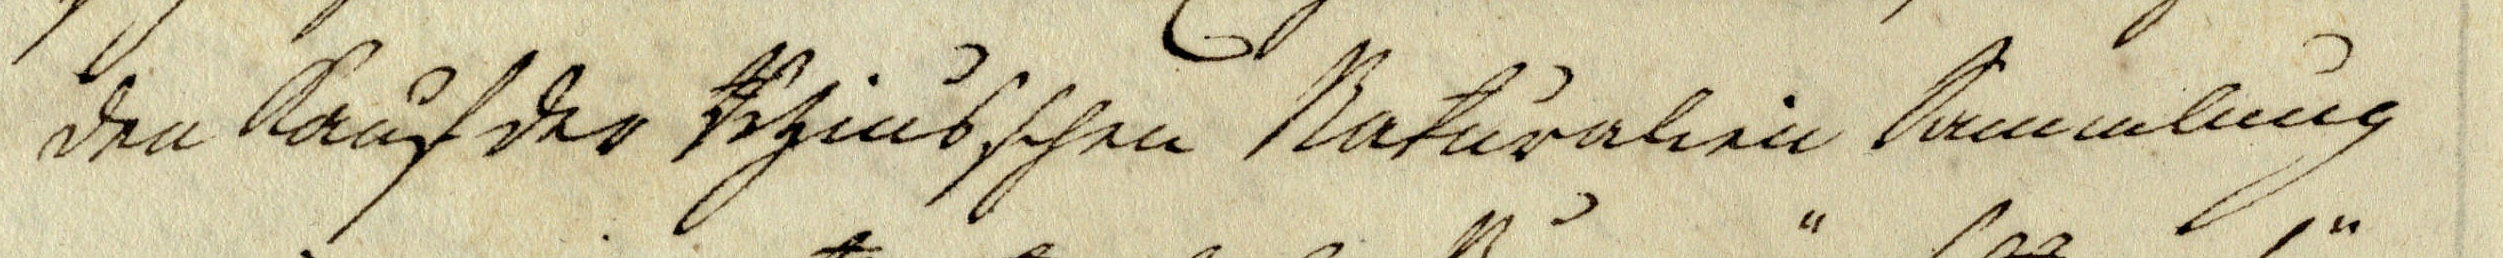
den Kauf der Reziusschen Naturalien Sammlung
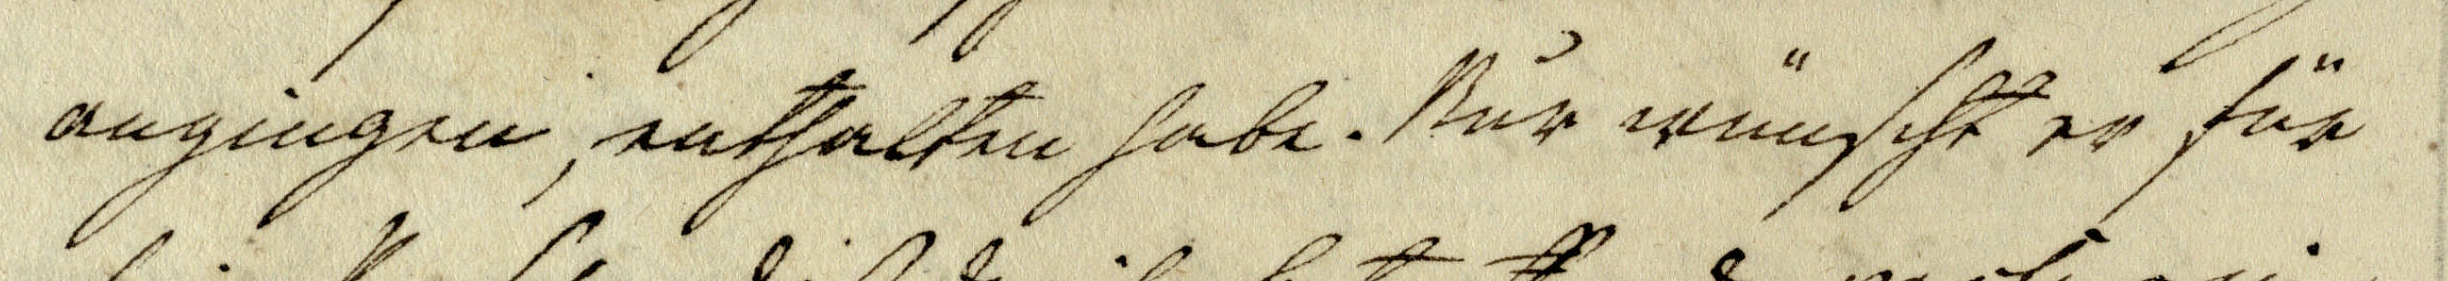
angingen enthalten habe. Nur wünscht er für
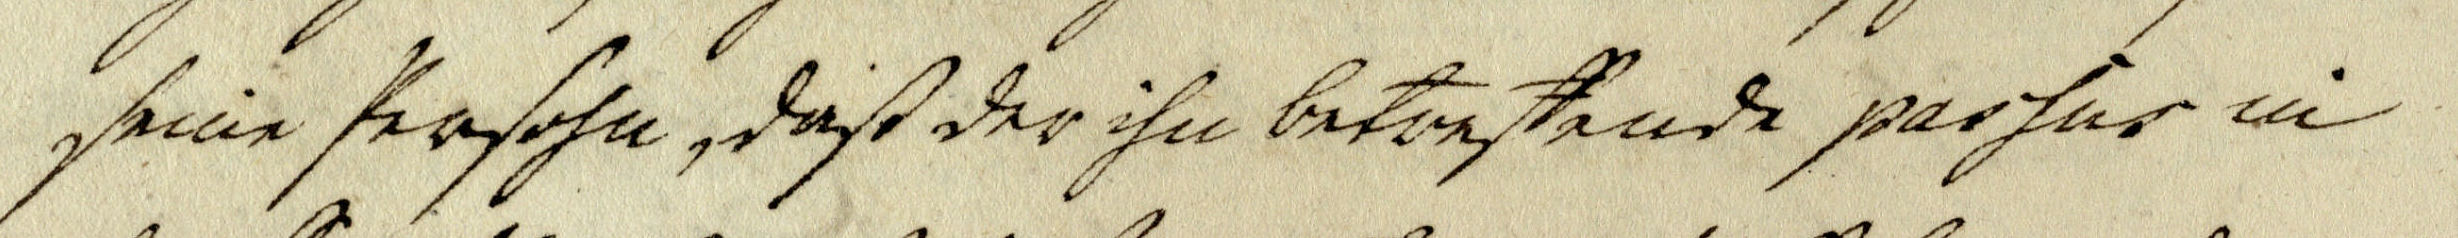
seine Persohn, daß der ihn betreffende passus in
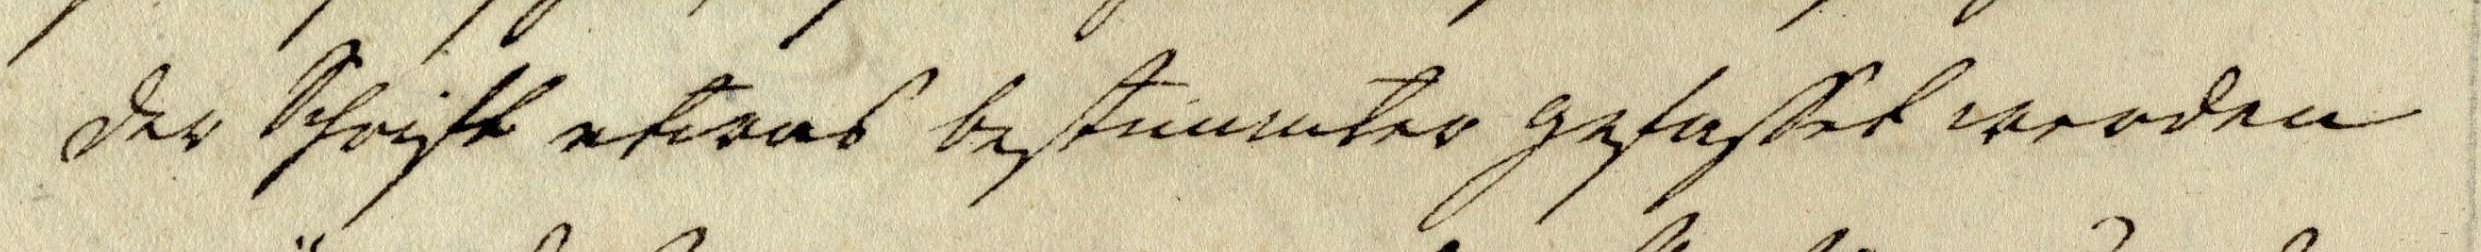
der Schrift etwas bestimmter gefasset werden
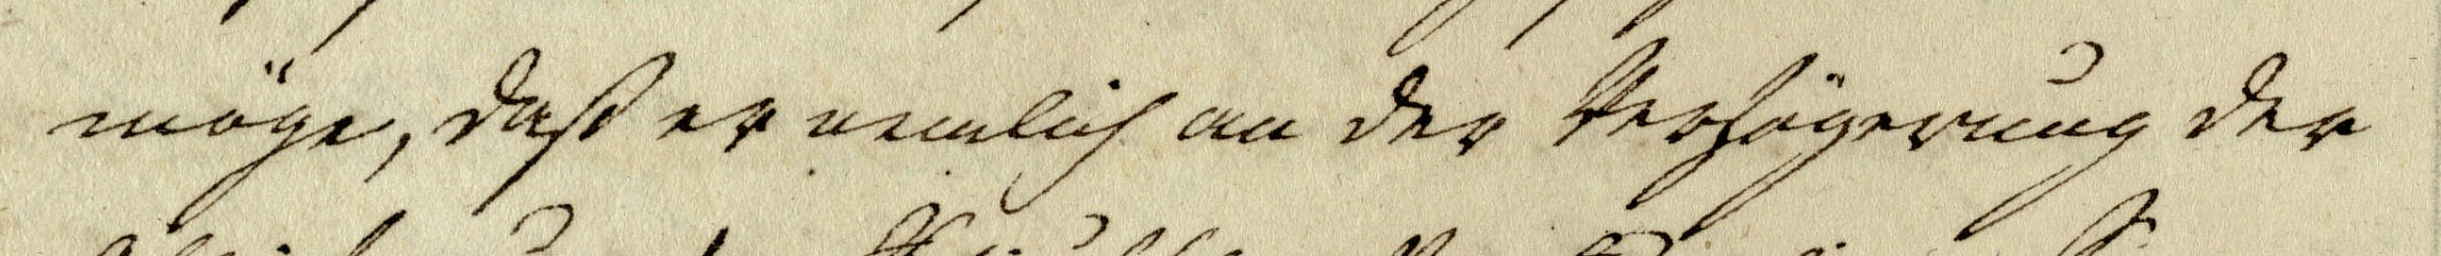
möge, daß er nemlich an der Verzögerung der
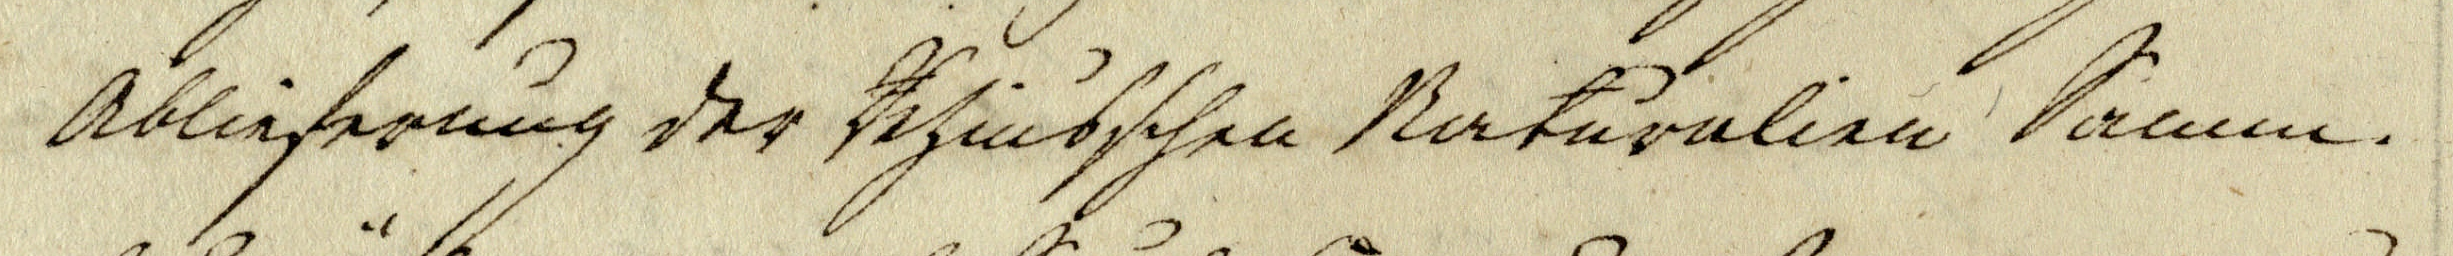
Ablieferung der Reziusschen Naturalien Samm¬
